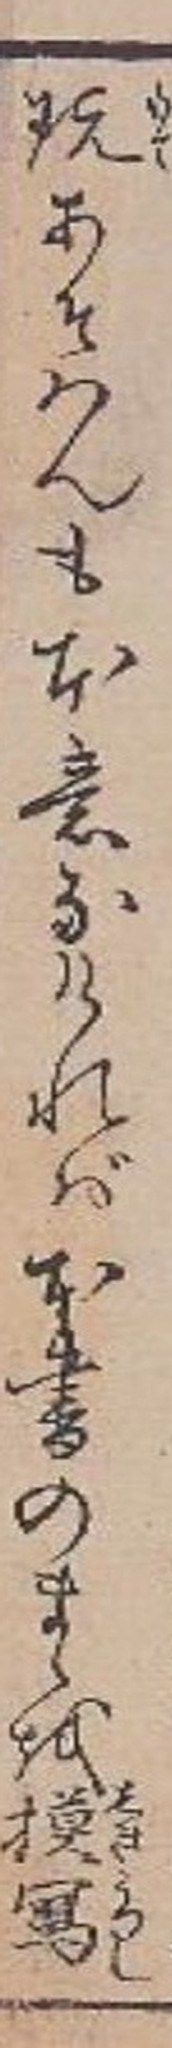玩あそはんも本意なければ本書のまゝを模写
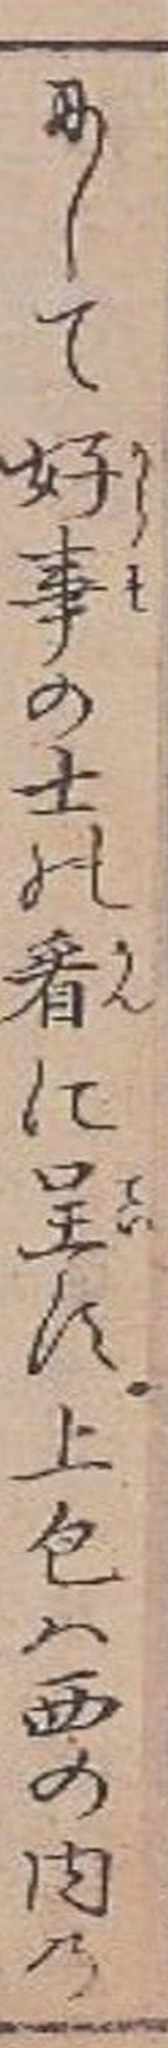にして好事の士の看に呈す、上包は西の内の
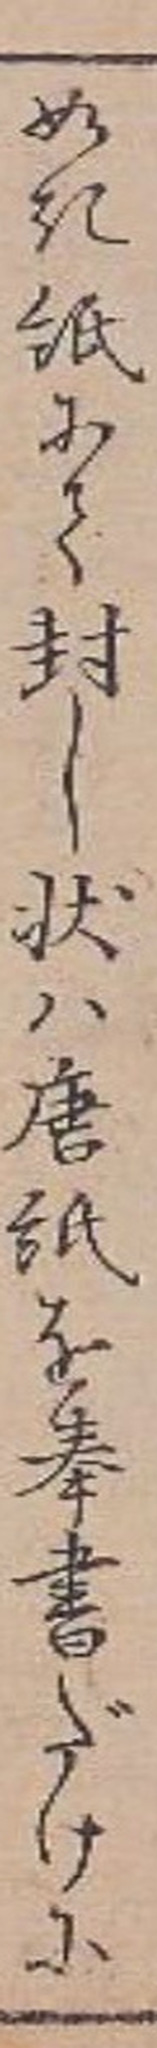如き紙にて封し状は唐紙を奉書だけに
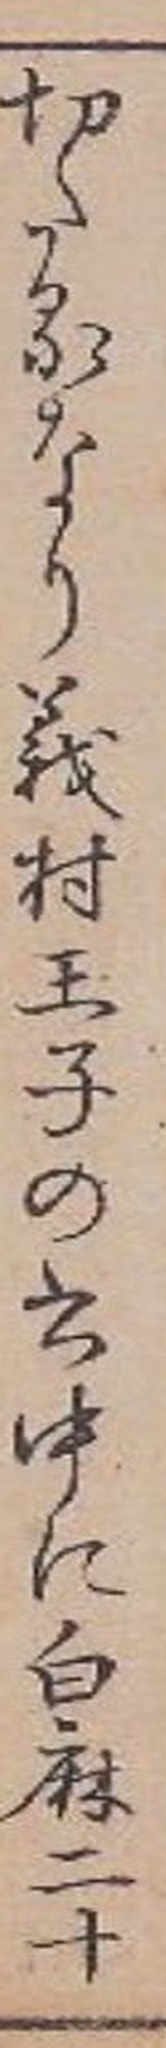切たるなり義村王子の書中に白麻二十
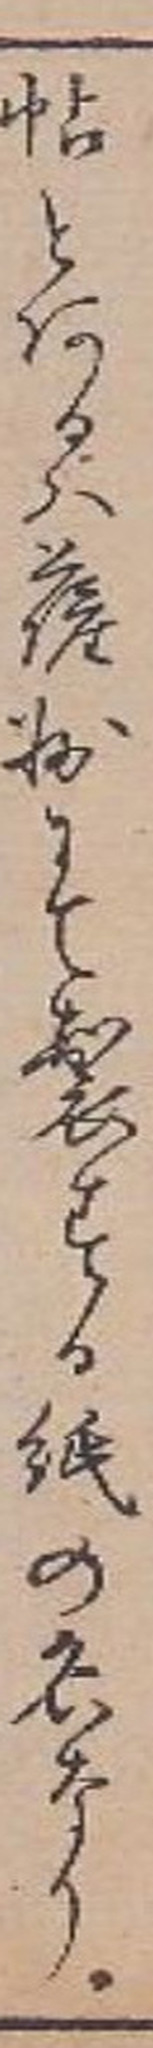帖とあるは薩州にて製する紙の名なり、
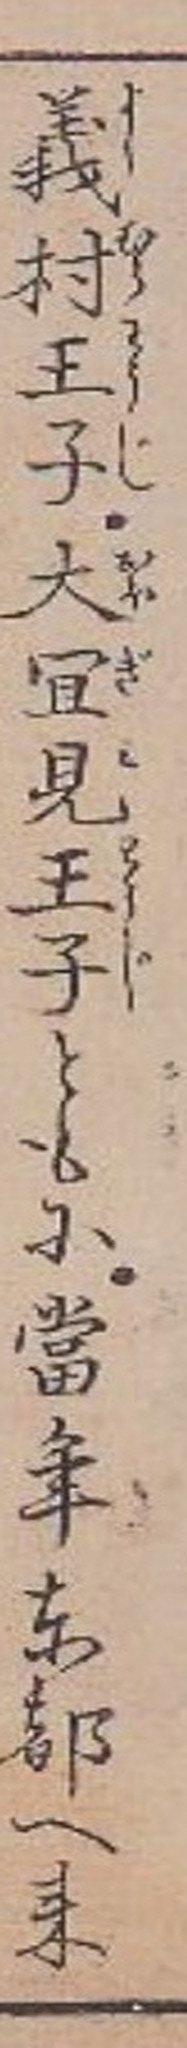義村王子、大宜見王子ともに、当年東都へ來
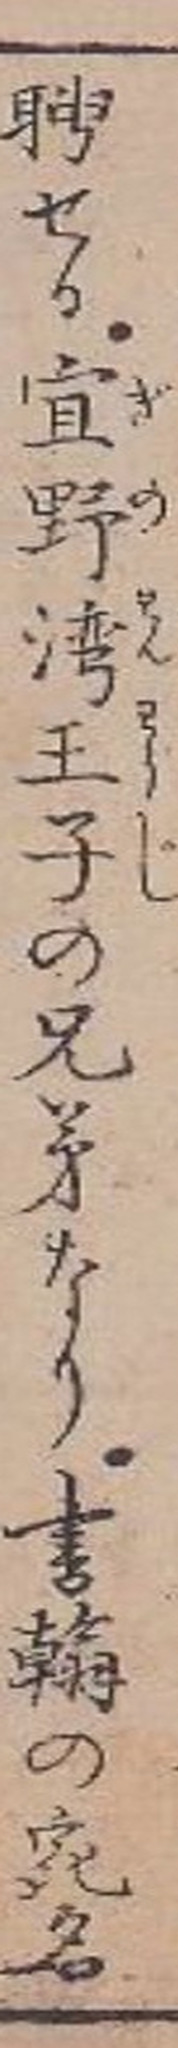聘せる、宜野湾王子の兄弟なり、書翰の宛名
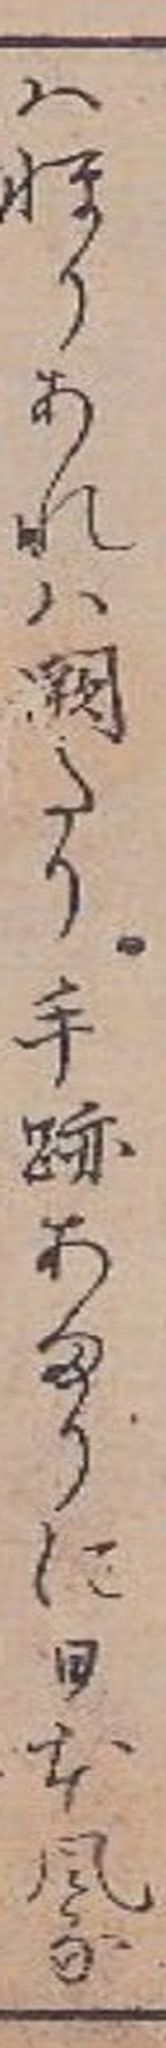は憚りあれは闕たり、手跡あまりに日本風な
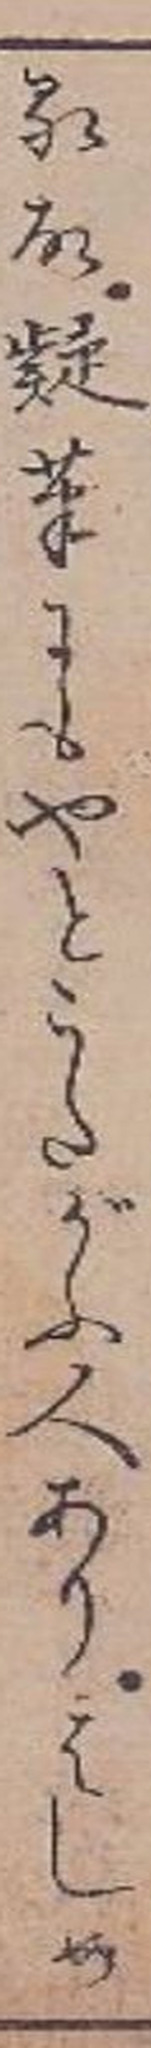る故、疑筆にもやとうたがふ人あり、はしめ
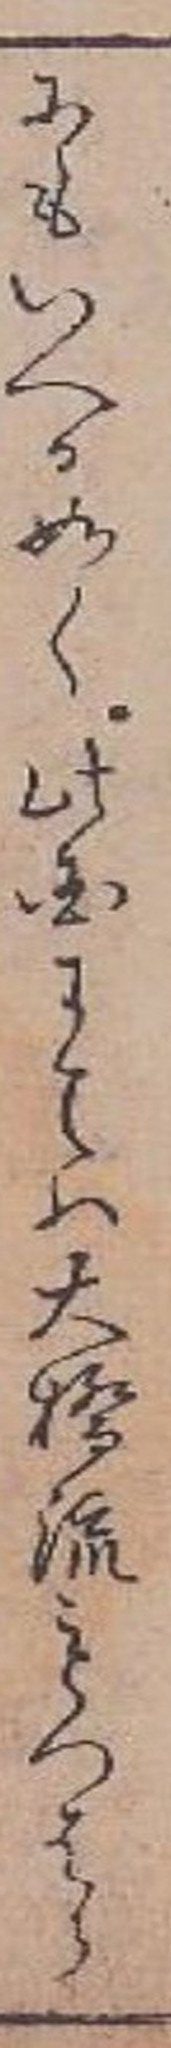にもいへる如く、此国にては大橋流もつはら
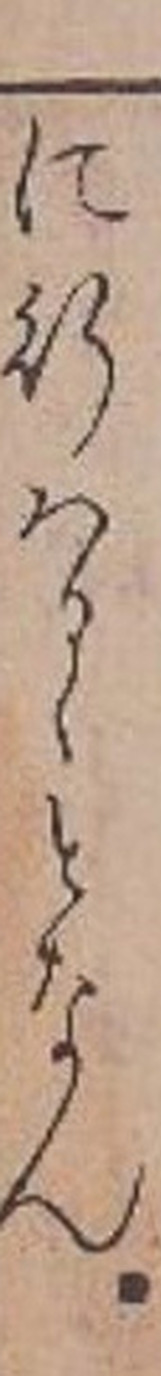に行はるゝとなん、

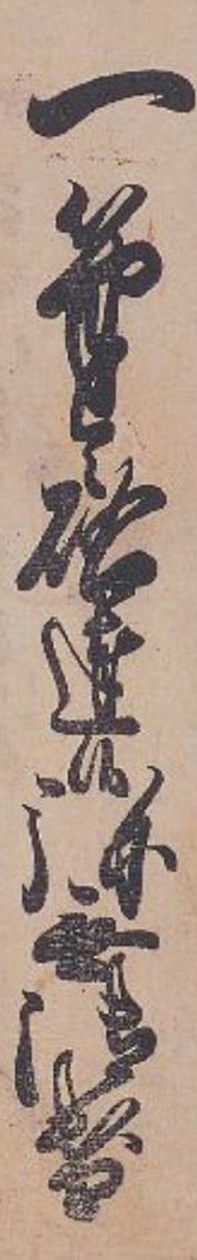一筆令啓達候弥無御替
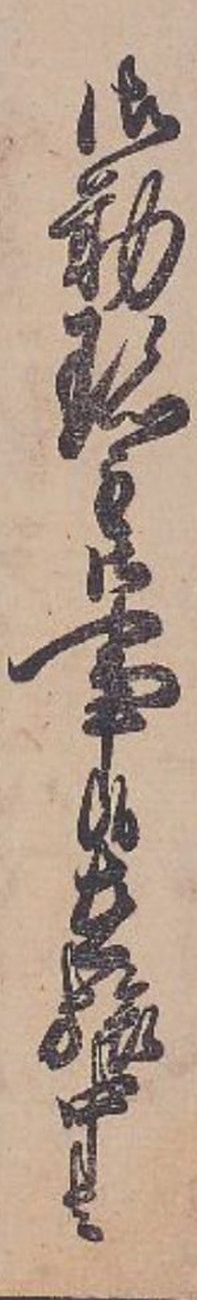御勤珍重御事候在旅中は
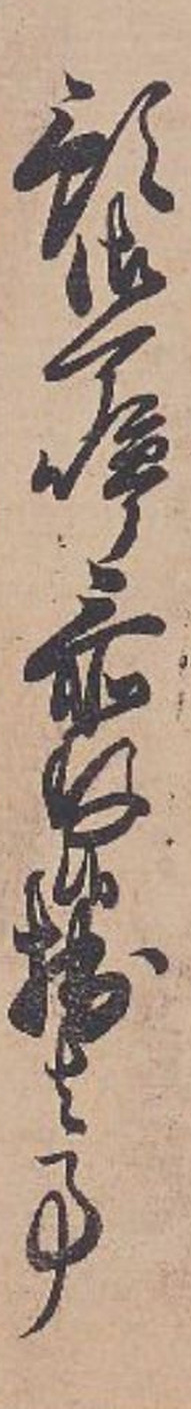預御丁嚀忝存候拙者事
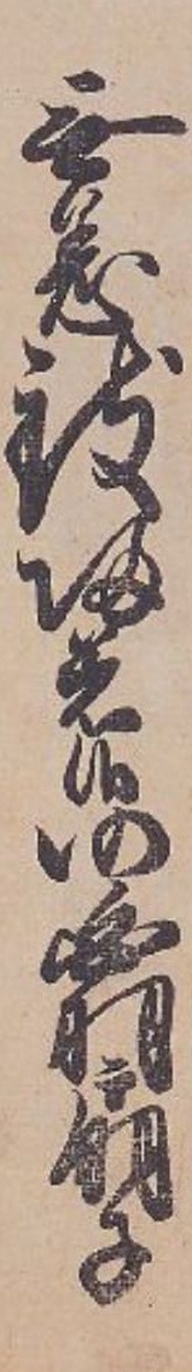無恙致帰着候仍白羽扇子
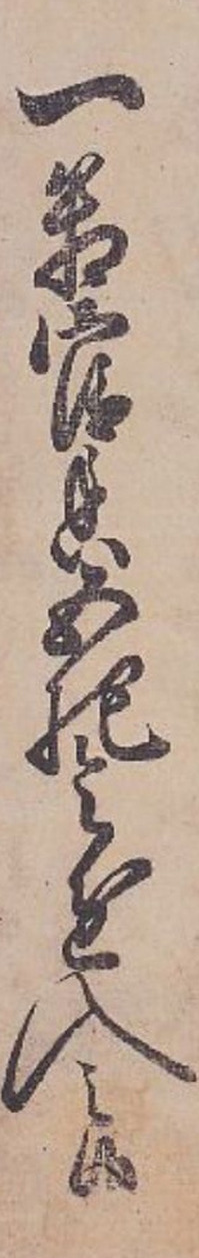一箱官香五把令進入之候
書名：琉球談
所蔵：University of the Ryukyus Library
